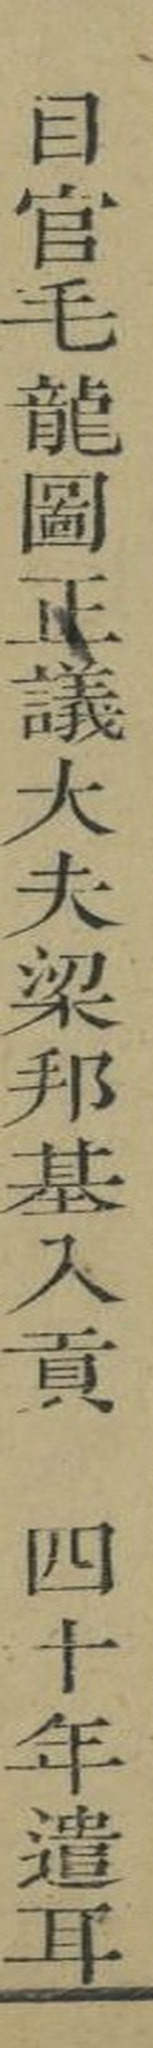目官毛竜図正議大夫梁邦基入貢四十年遣耳
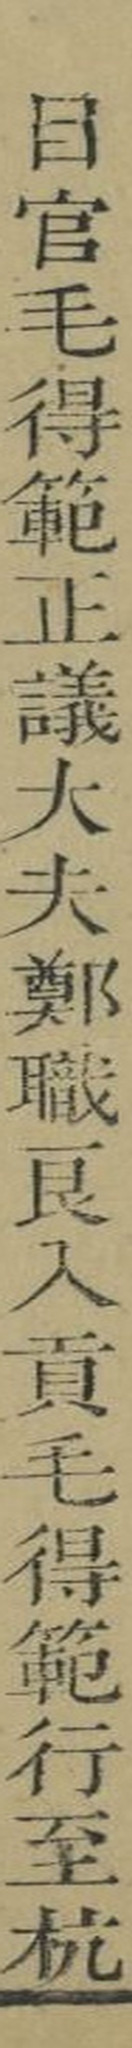目官毛得範正議大夫鄭職良入貢毛得範行至杭
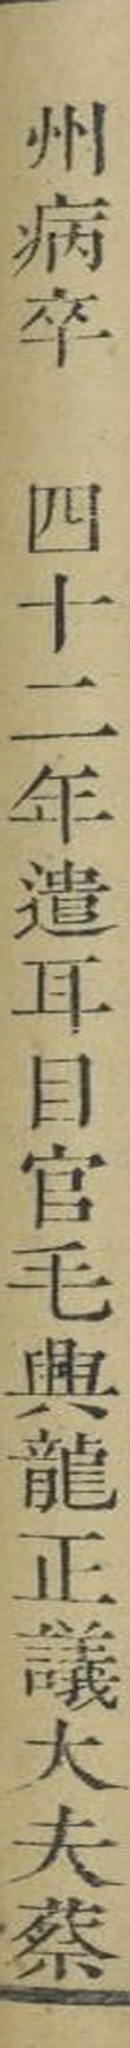州病卒四十二年遣耳目官毛興竜正議大夫蔡
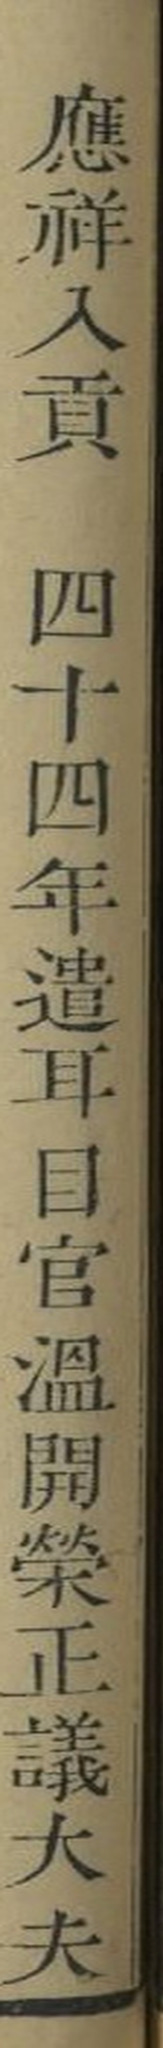応祥入貢四十四年遣耳目官温開栄正議大夫
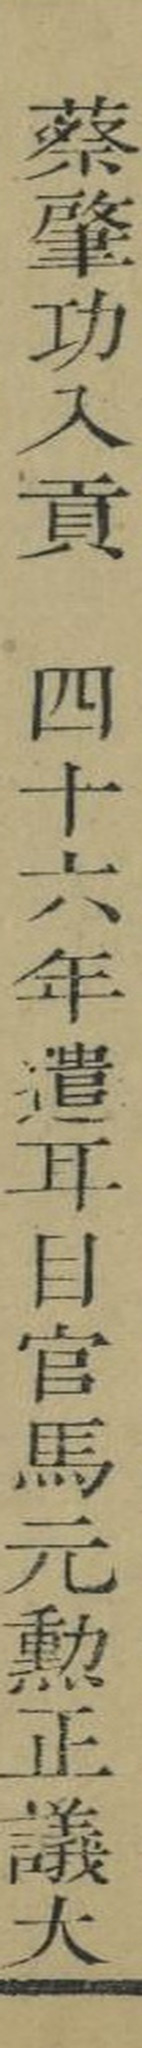蔡肇功入貢四十六年遣耳目官馬元勲正議大
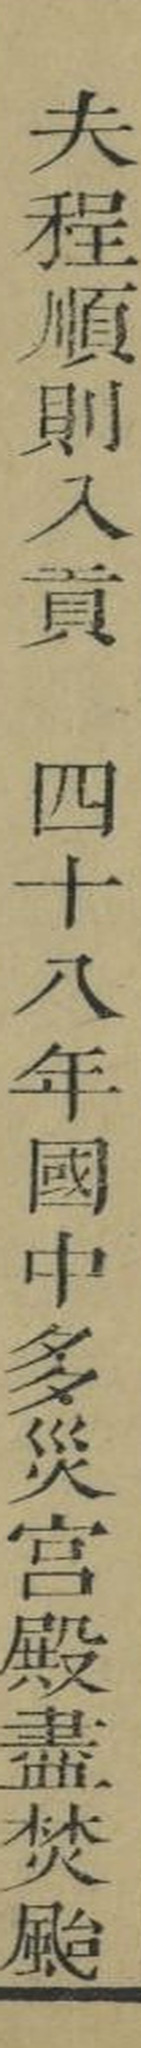夫程順則入貢四十八年国中多災宮殿尽焚颱
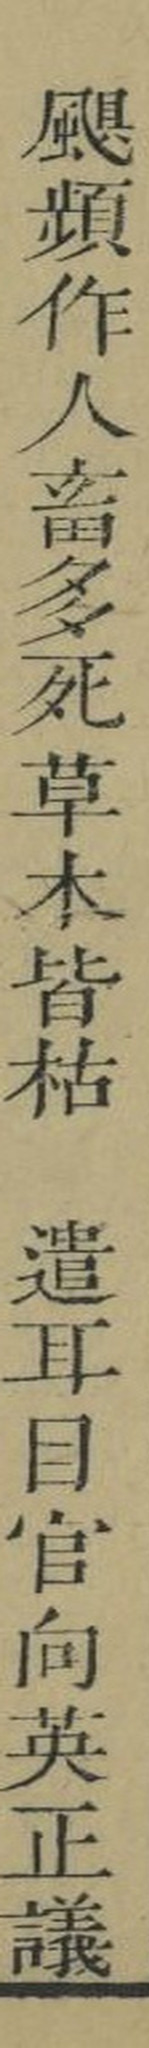颶頻作人畜多死草木皆枯遣耳目官向英正議
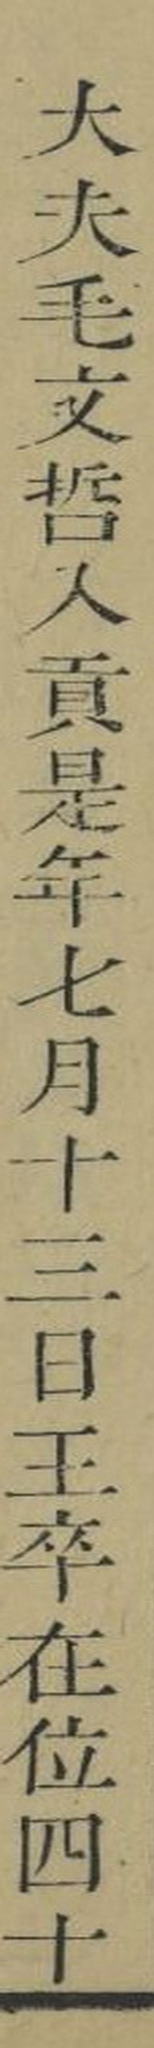大夫毛文哲入貢是年七月十三日王卒在位四十
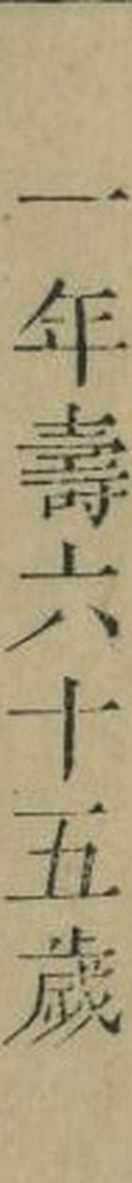一年寿六十五歳
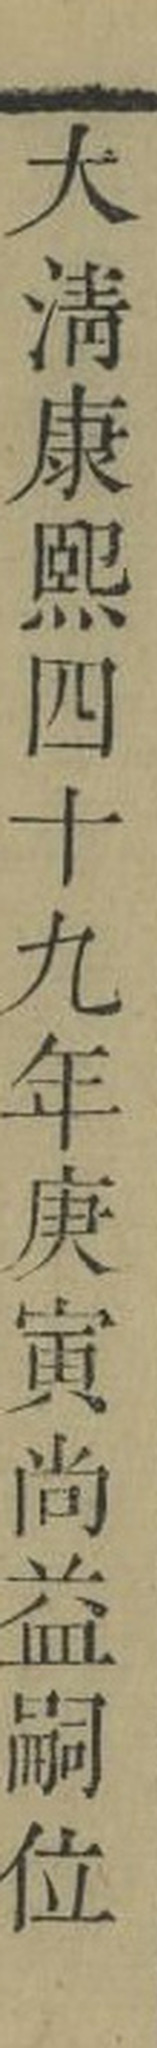大清康煕四十九年庚寅尚益嗣位
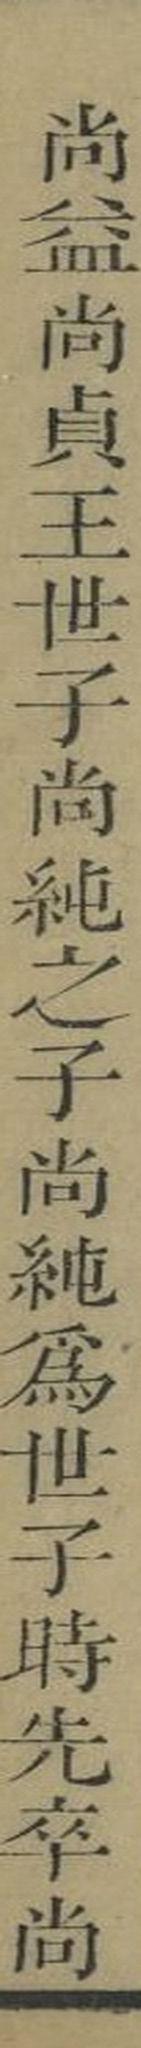尚益尚貞王世子尚純之子尚純為世子時先卒尚

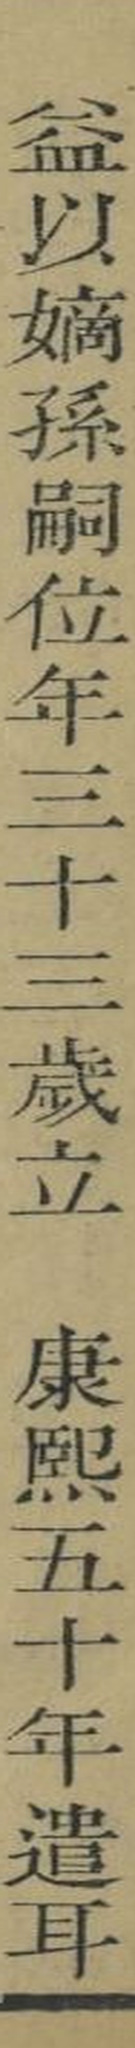益以嫡孫嗣位年三十三歳立康煕五十年遣耳
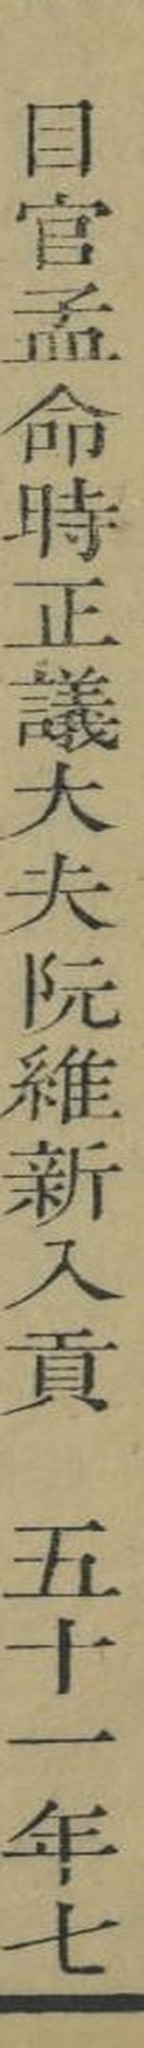目官孟命時正議大夫阮維新入貢五十一年七
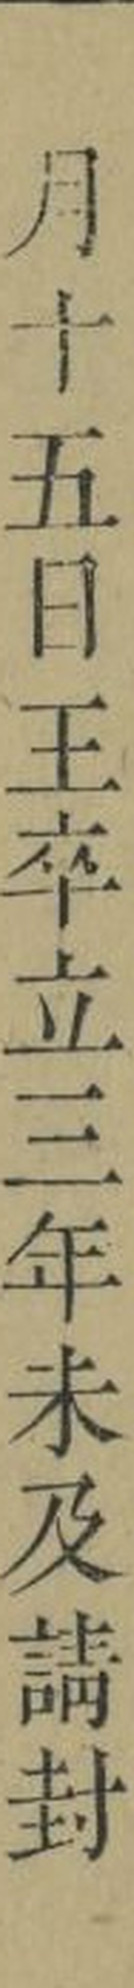月十五日王卒立三年未及請封
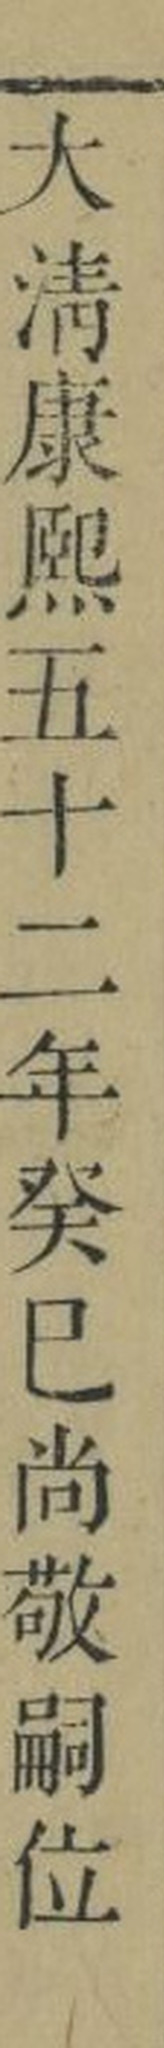大清康煕五十二年癸巳尚敬嗣位
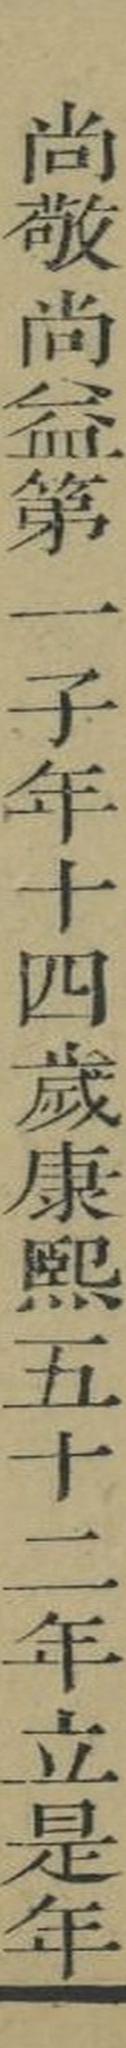尚敬尚益第一子年十四歳康煕五十二年立是年
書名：中山伝信録 巻三
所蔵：University of the Ryukyus Library
